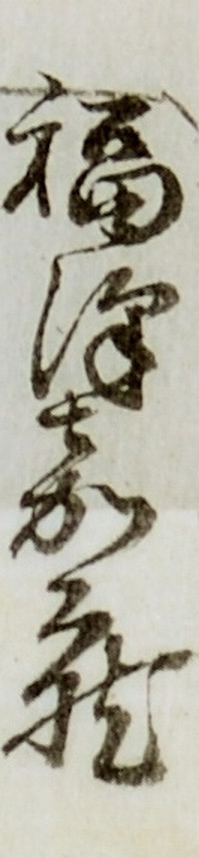福沢嘉蔵
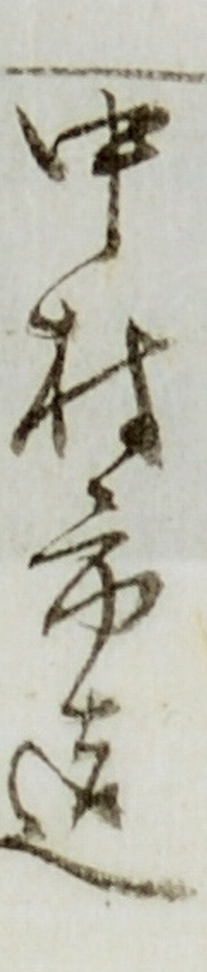中村市造
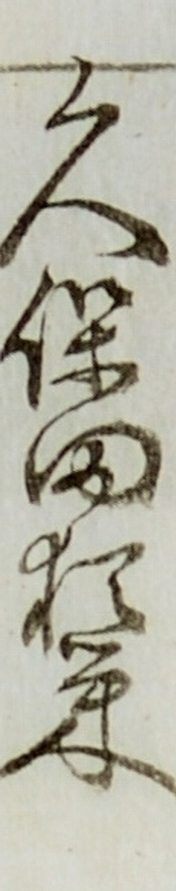久保田猶栄

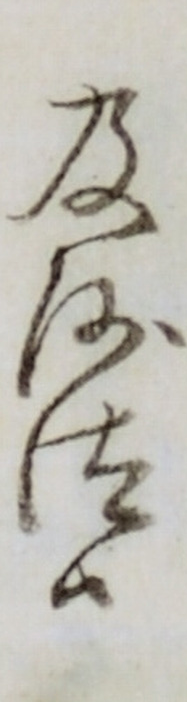及沙汰候
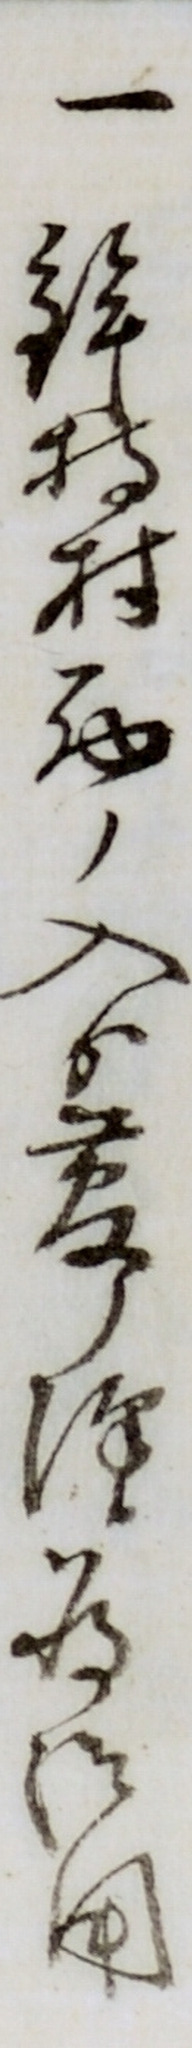一鉾持村西ノ入ゟ菅ノ沢え為御用
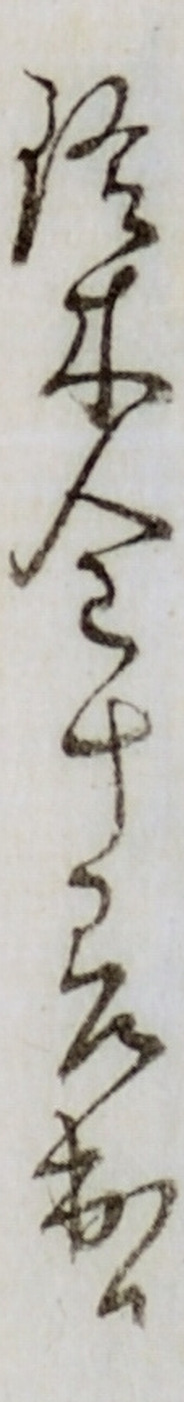鈴木金十差出候
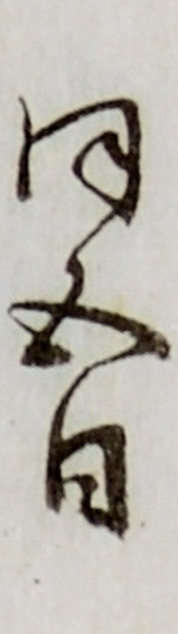同五日
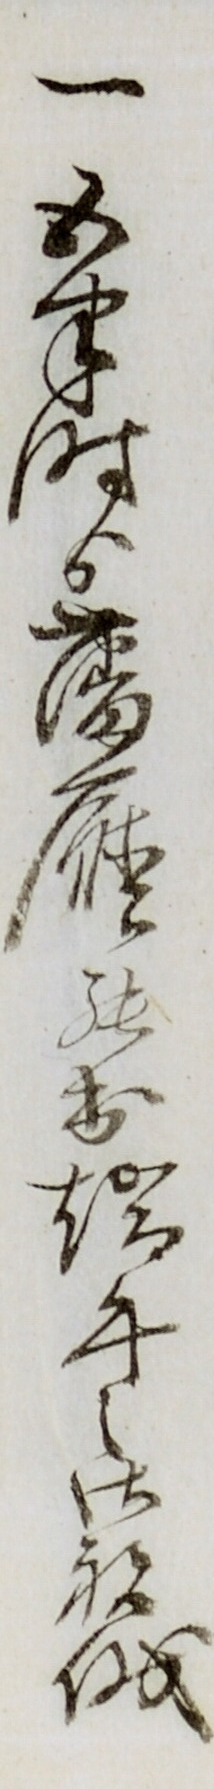一五半時ゟ藩庁え罷出端午之御祝儀
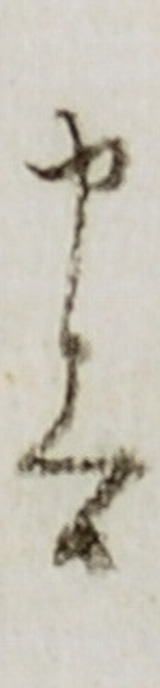申上候
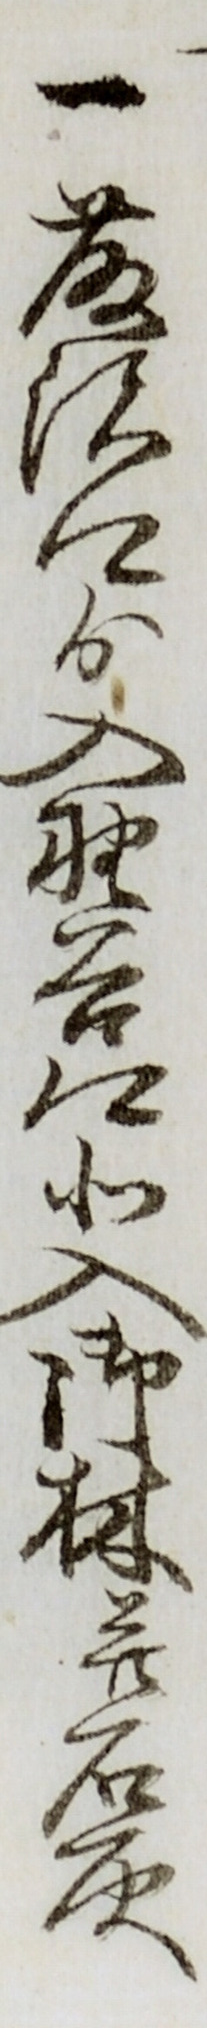一藤沢郷ゟ入野谷郷北入御林幷石灰
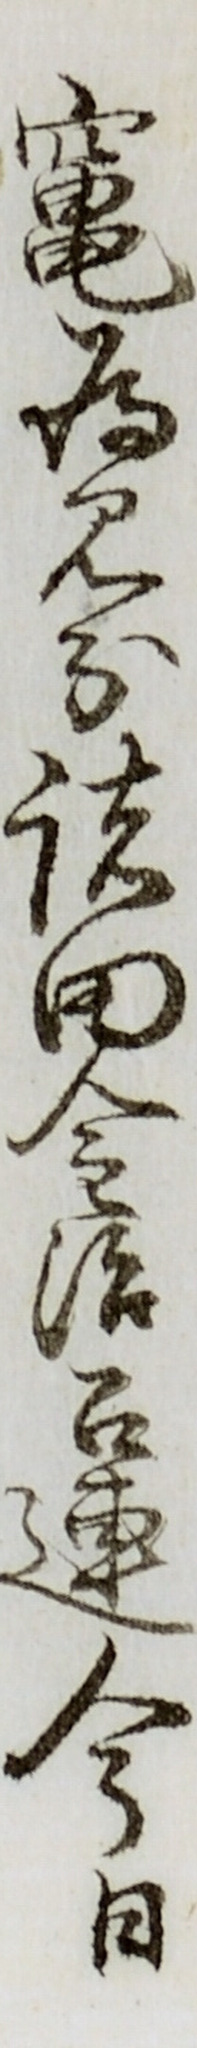竃為見分諸田金治召連今日
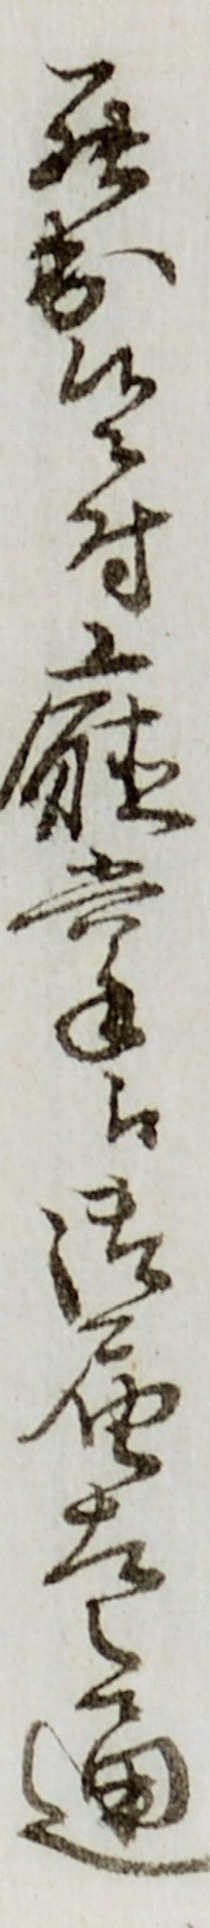罷出候に付庁掌え御届左之通
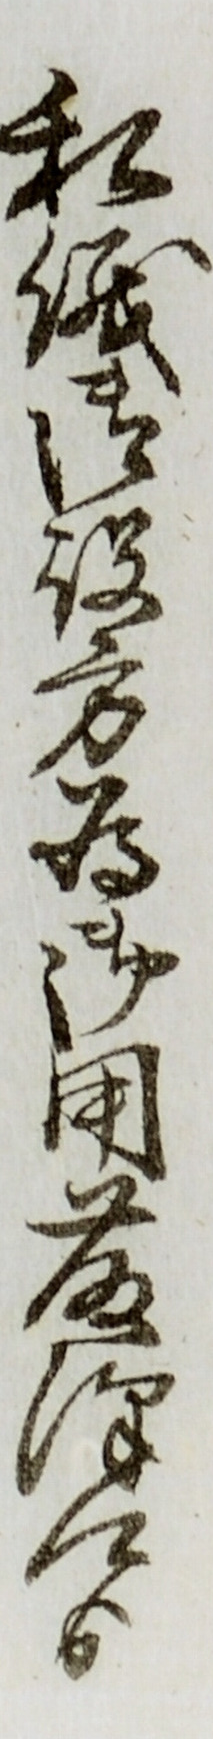私儀御役方為御用藤沢郷ゟ
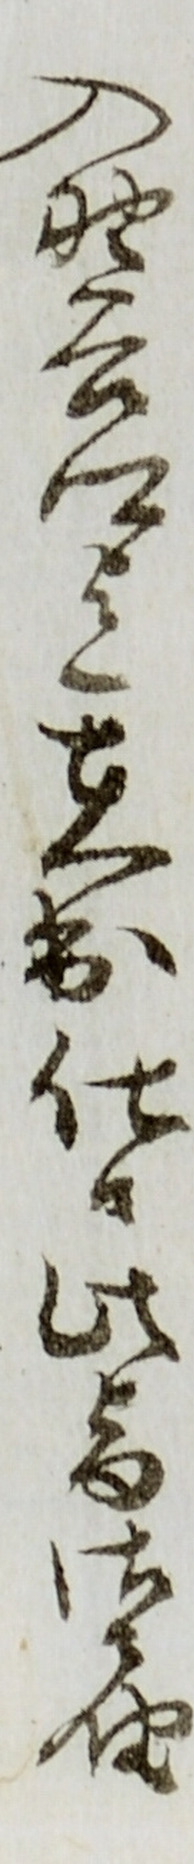入野谷郷迄在出仕候此旨御届
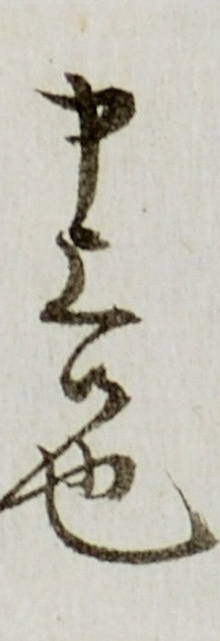申上候也
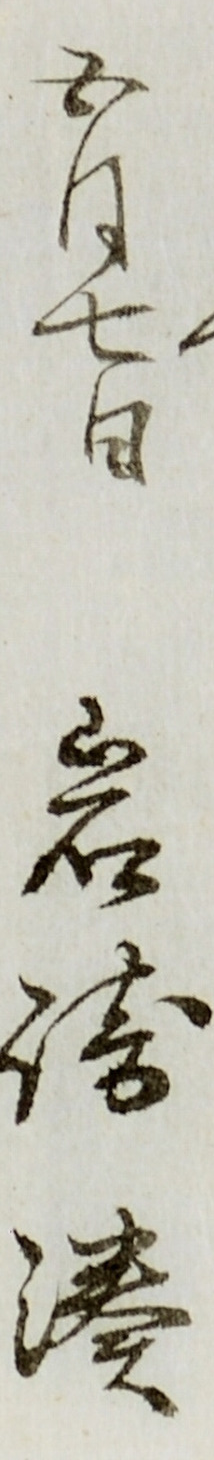五月七日岩崎湊
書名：山林方諸事御用留
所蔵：伊那市立高遠町図書館・合同会社AMANE
